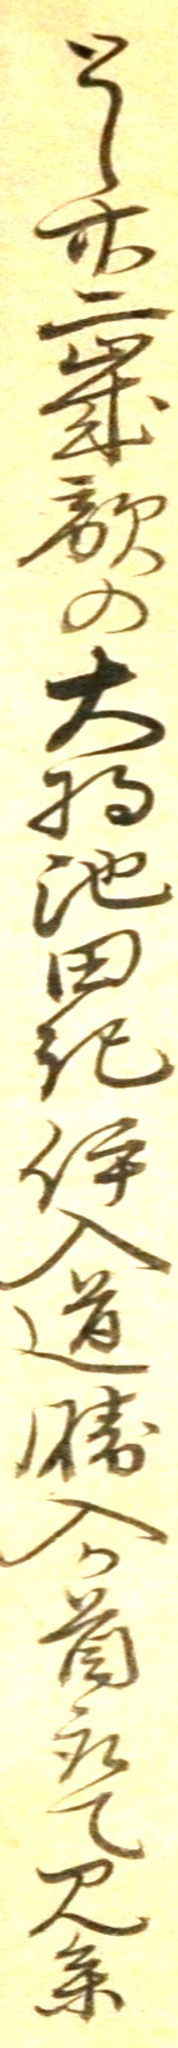とし廿二歳敵の大将池田紀伊入道勝入か首取て見参
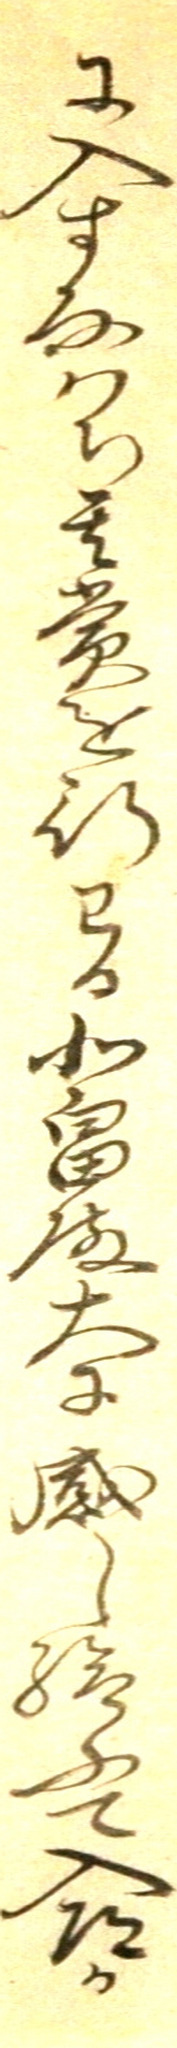に入すなわち其賞を行わる北畠殿大に感し給ふて入道か
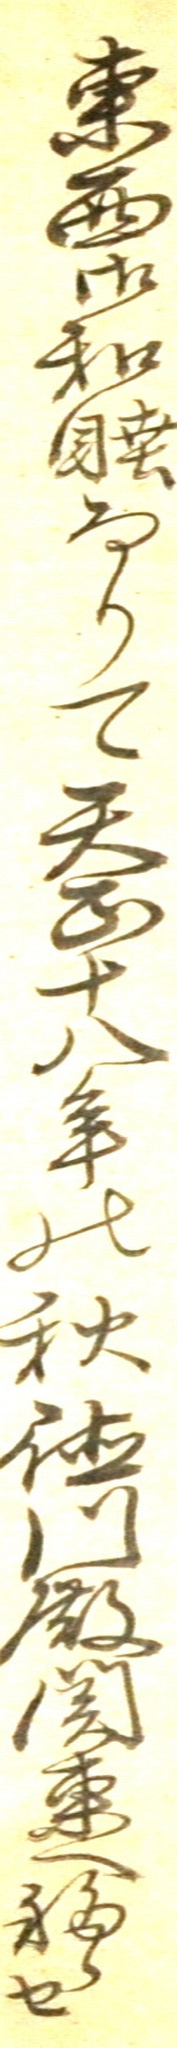東西御和睦なりて天正十八年の秋徳川殿関東へ移らせ
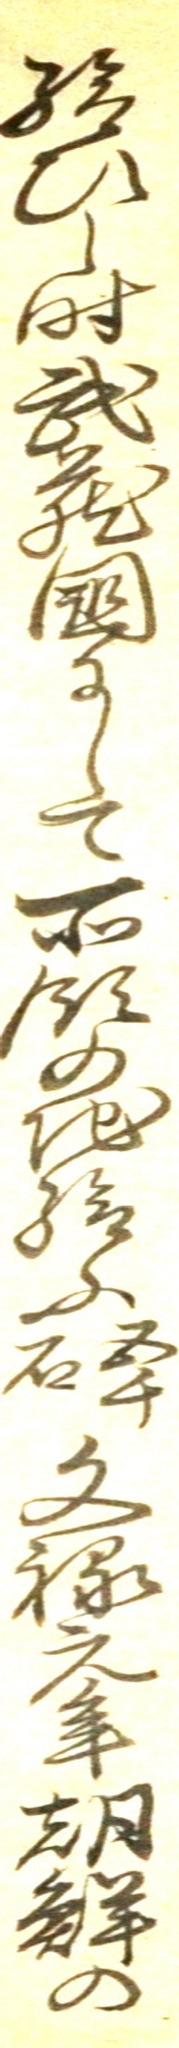給ひし時武蔵国にして所領の地給ふ五千石文禄元年朝鮮の
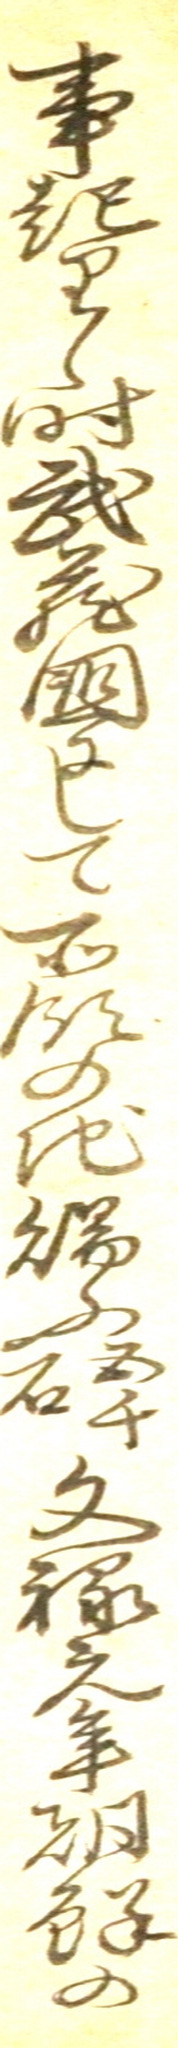事起りし時武蔵国にして所領の地賜ふ五千石文禄元年朝鮮の
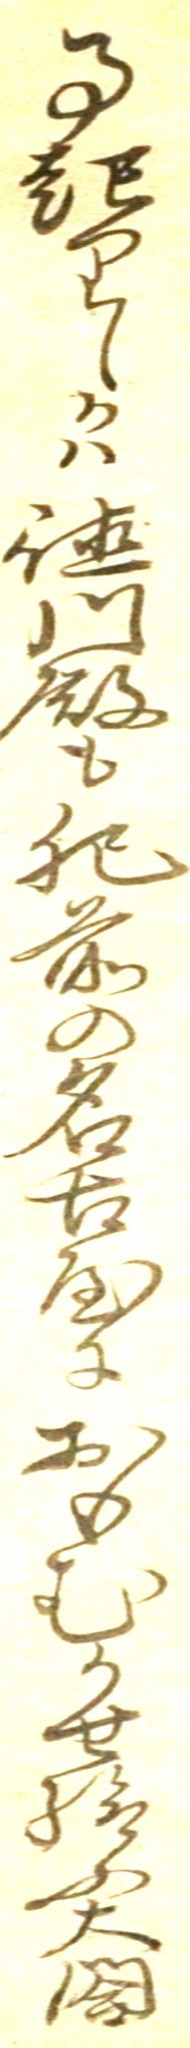事起りしかは徳川殿も肥前の名古屋におもむかせ給ふ太閤
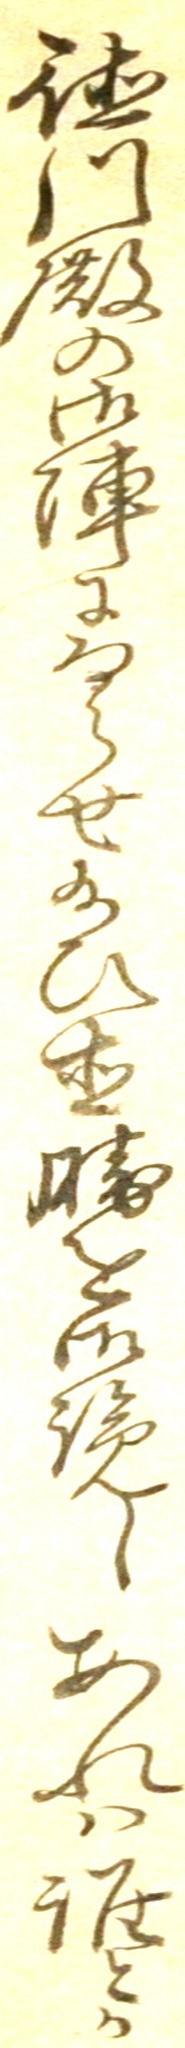徳川殿の御陣にならせ給ひ直勝を御覧しあれは誰とか
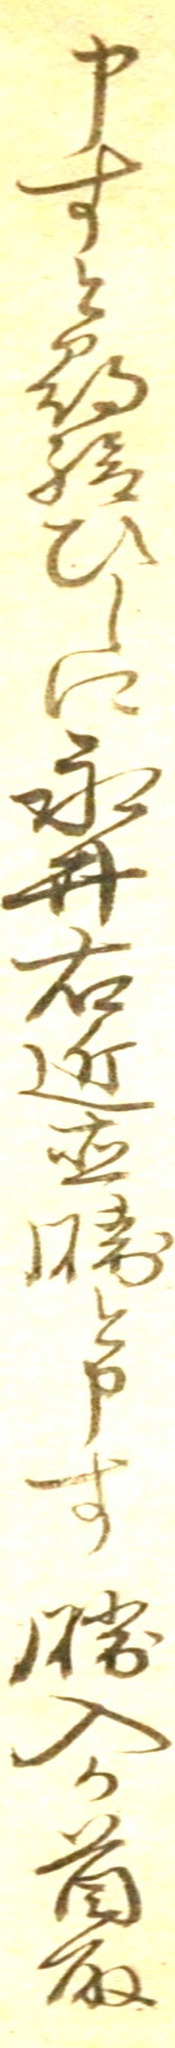申すと尋給ひしに永井右近直勝と申す勝入か首取
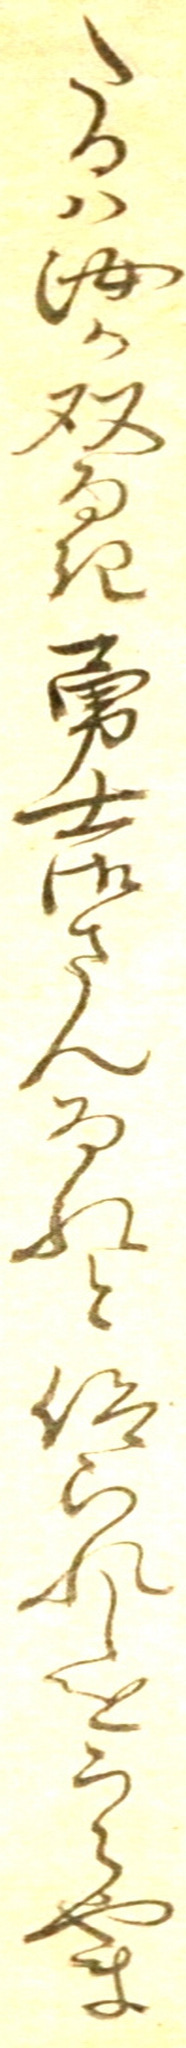たるは汝か双なき勇士御さんなれと仰られしをうらやま
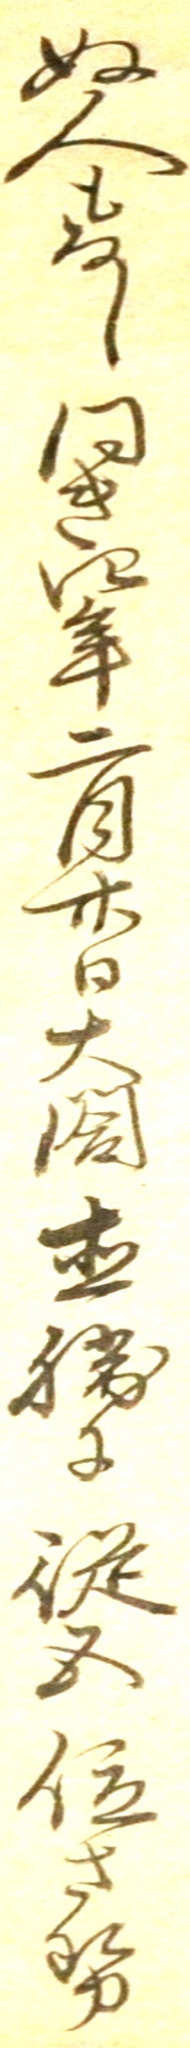ぬ人もなし同き四年二月廿日太閤直勝に従五位させ
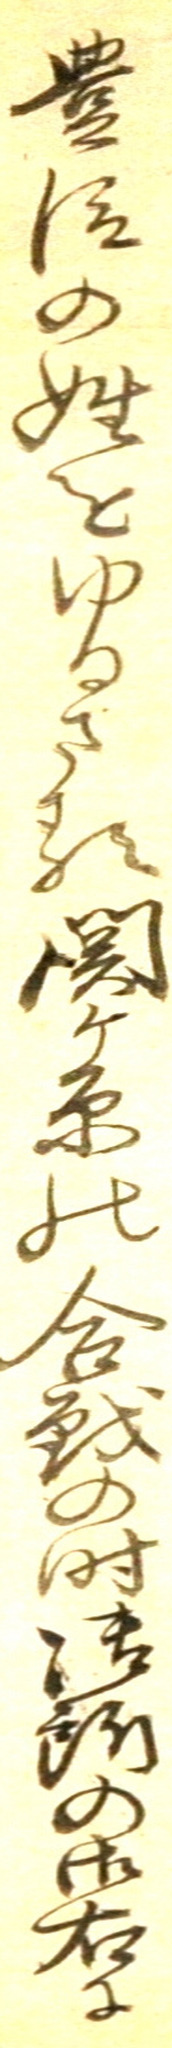豊臣の姓をゆるさる関ヶ原の合戦の時御所の御右に
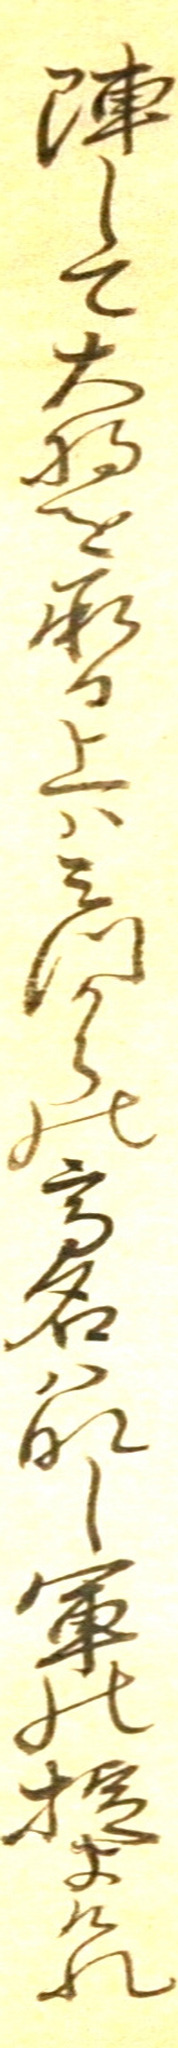陣して大将を承る上はみつからの高名はなし軍の掟よけれ

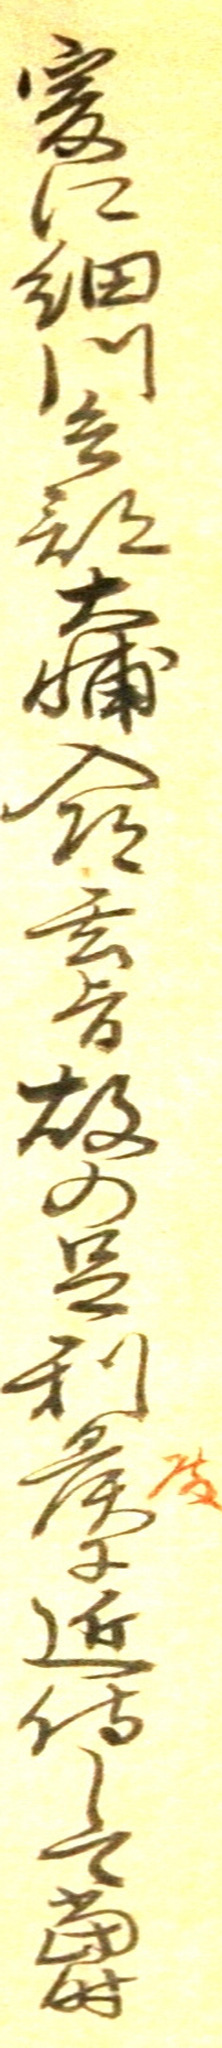爰に細川兵部大輔入道玄旨故の足利侯に近侍して当時
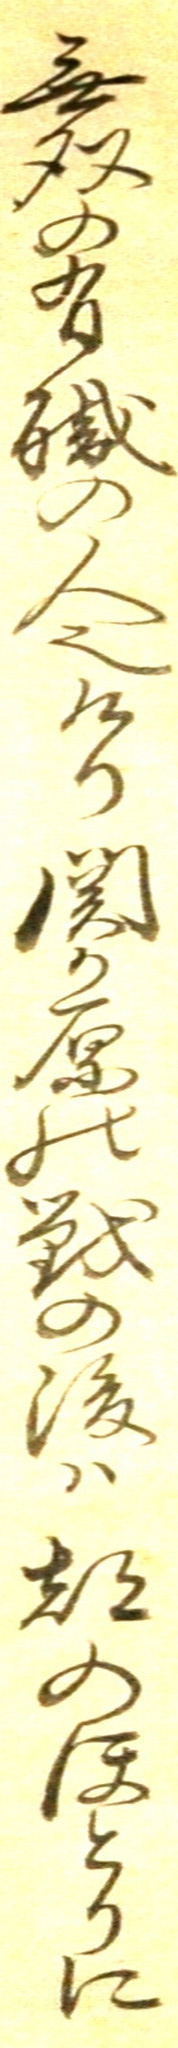無双の有職の人也けり関か原の戦の後は都のほとりに
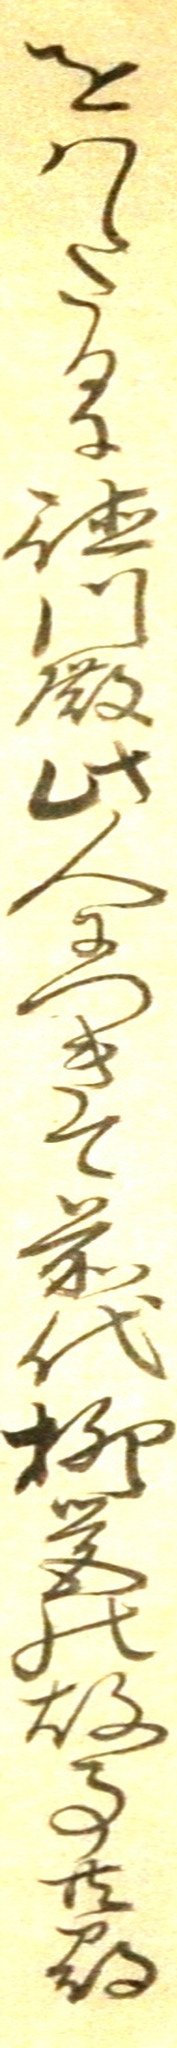をはしたるに徳川殿此人につきて前代柳営の故事共尋
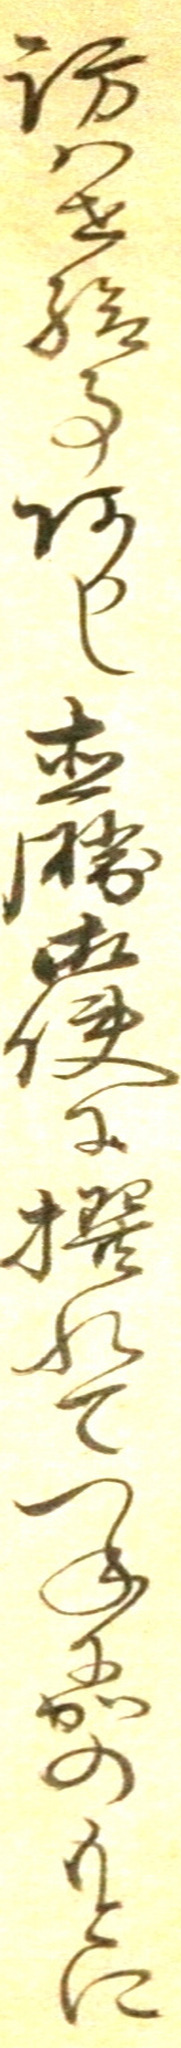訪はせ給事ありし直勝御使に撰れてつねにかのもとに
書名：藩翰譜（五）
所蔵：伊那市立高遠町図書館・合同会社AMANE
